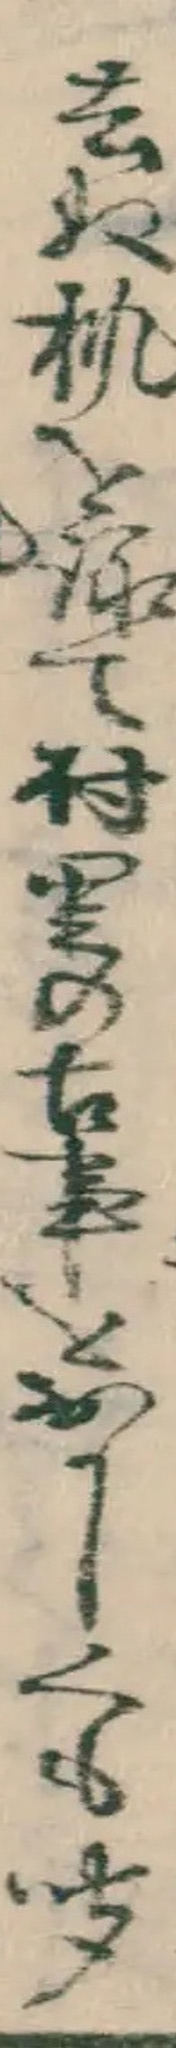去ぬ楓を詠て村里の古事をおかしくも聞
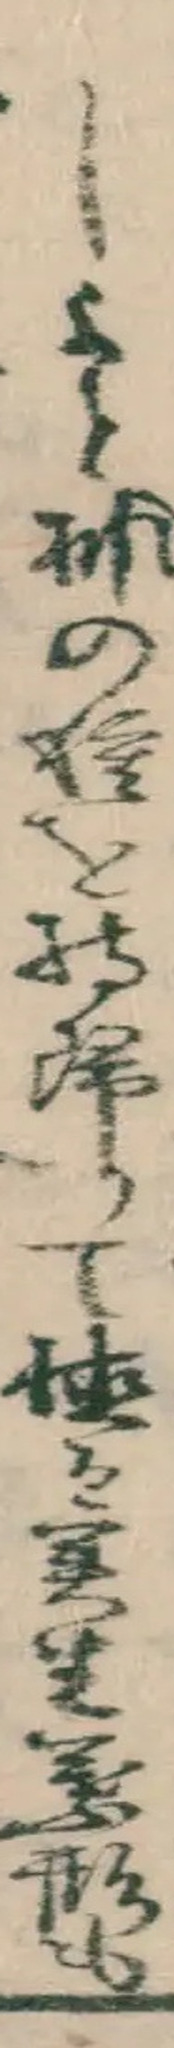しよと楓の種を持帰りて植る実生葉形も
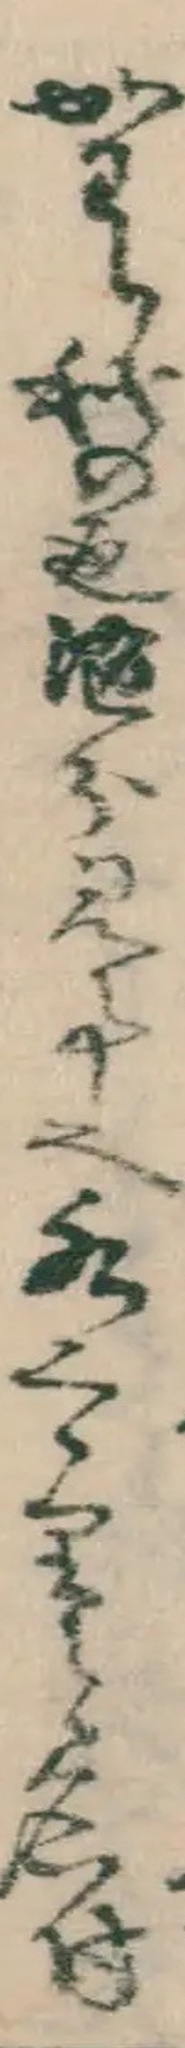かわり秋の色随分見事也水くゝりと名付
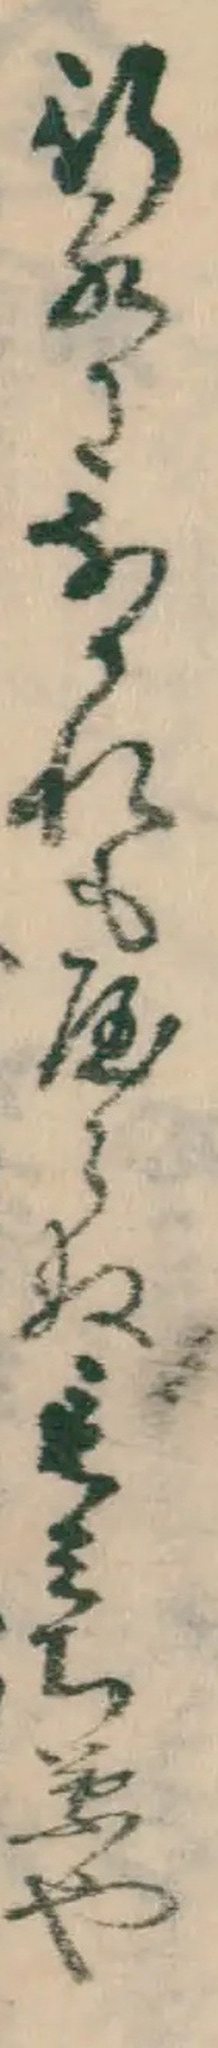行水になかれもやらぬもみち葉や
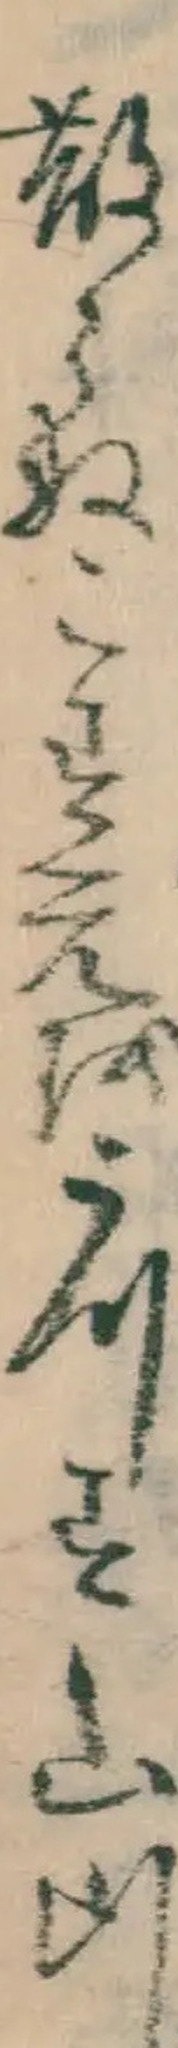散らぬこすえをうつす山川義延

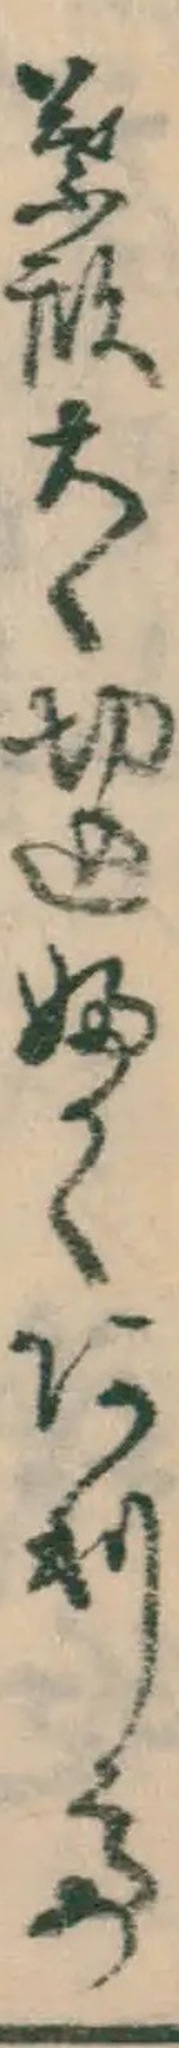金襴葉形大く切込ふかくありて
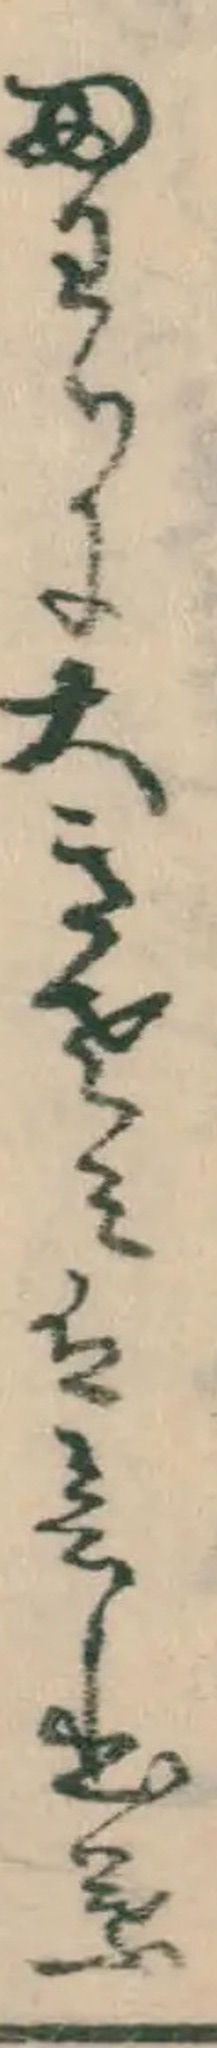まわりに大きさみ有春出葉
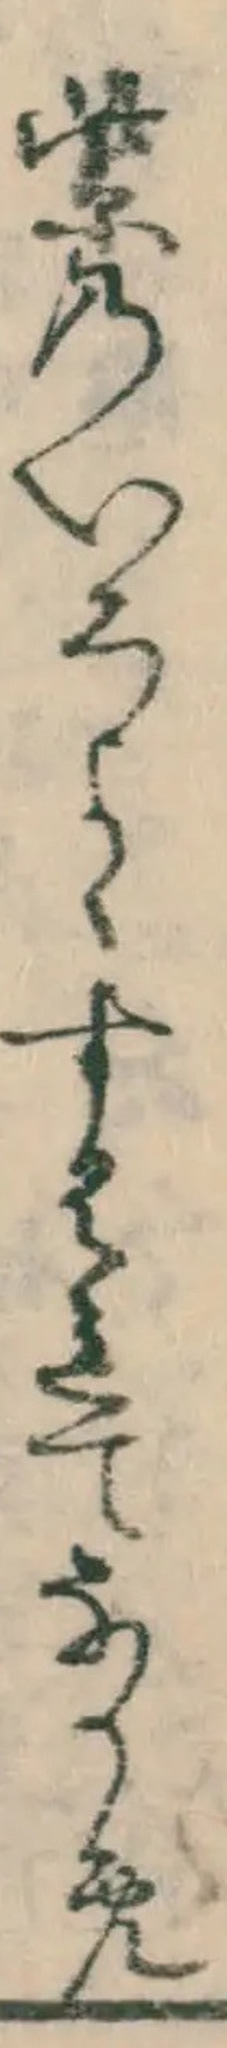紫のいろよくすくれてなかめ
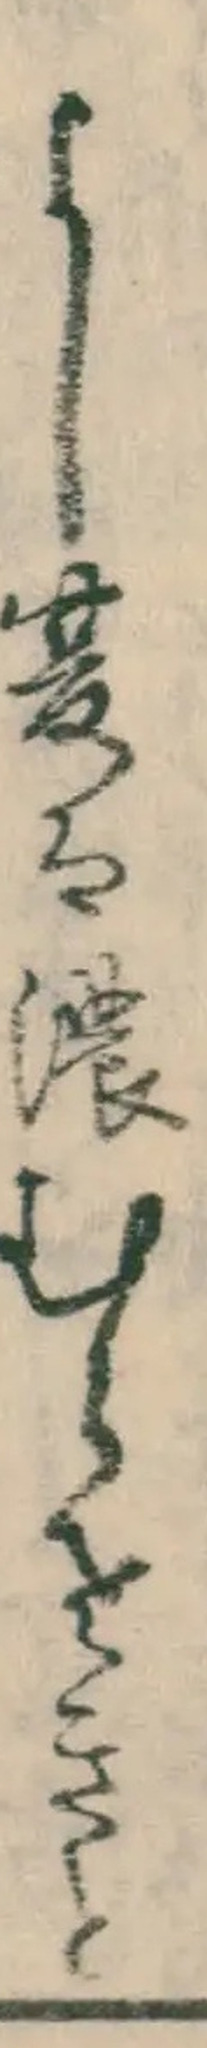よし夏は濃むらさきと
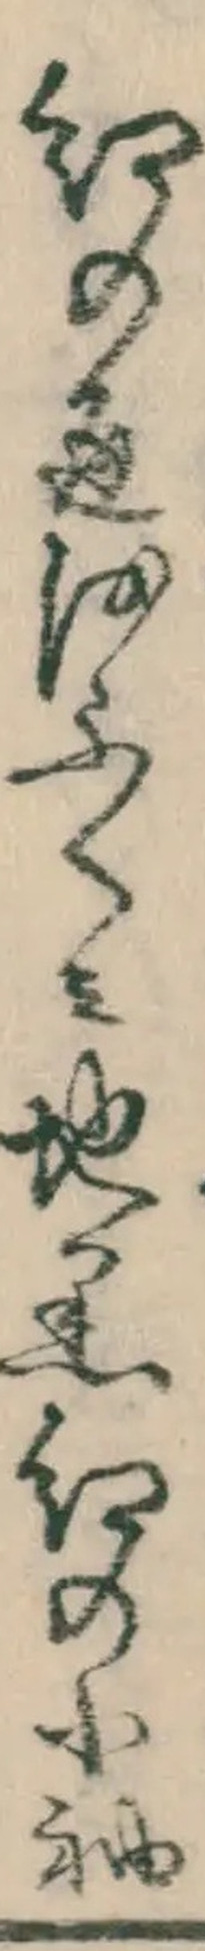紅の色をふくみ地黒紅の小袖
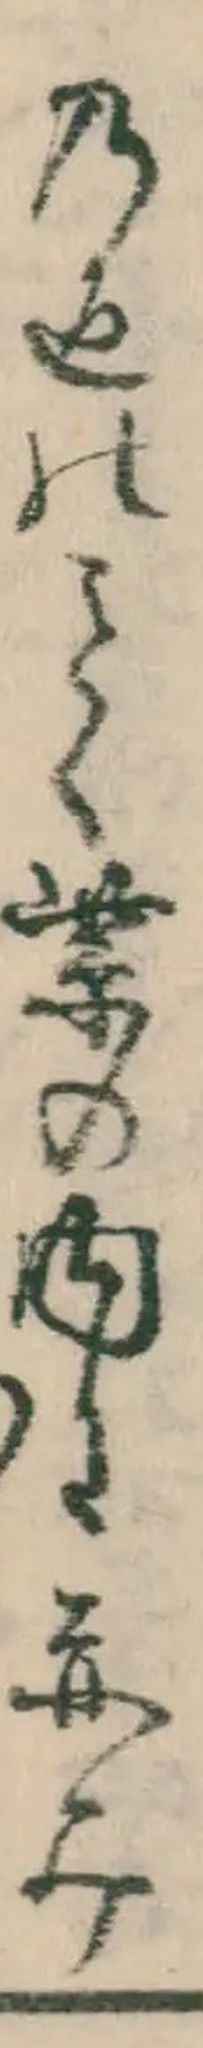の色のことく紫の内に赤み
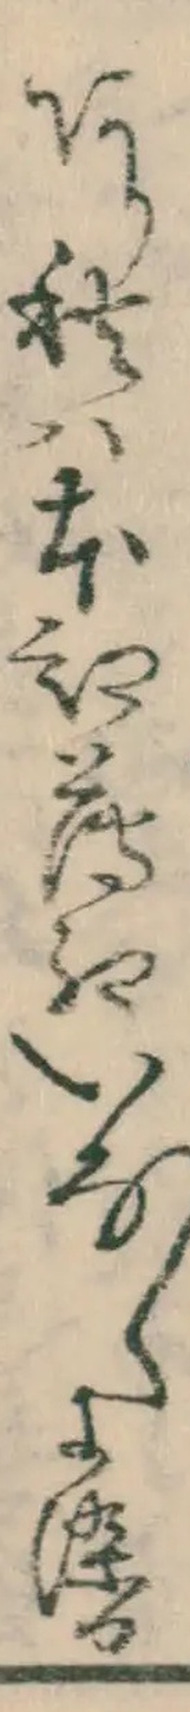あり秋は本紅薄紅いろ〳〵に染る
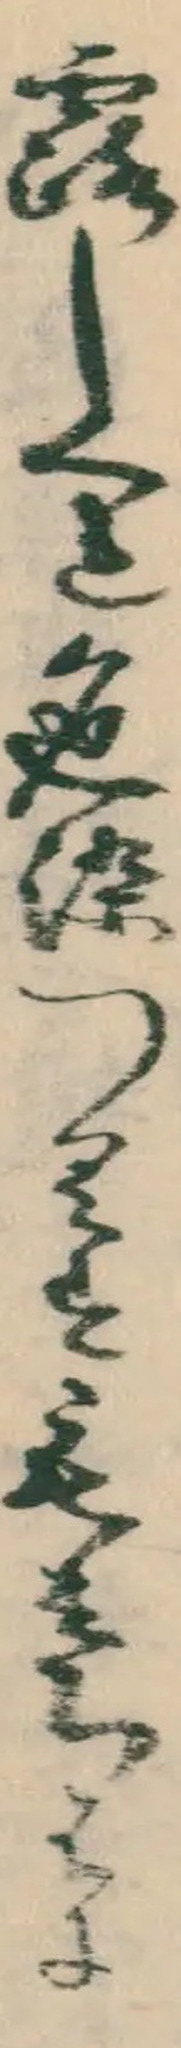露しくれ色染つくすもみちはに
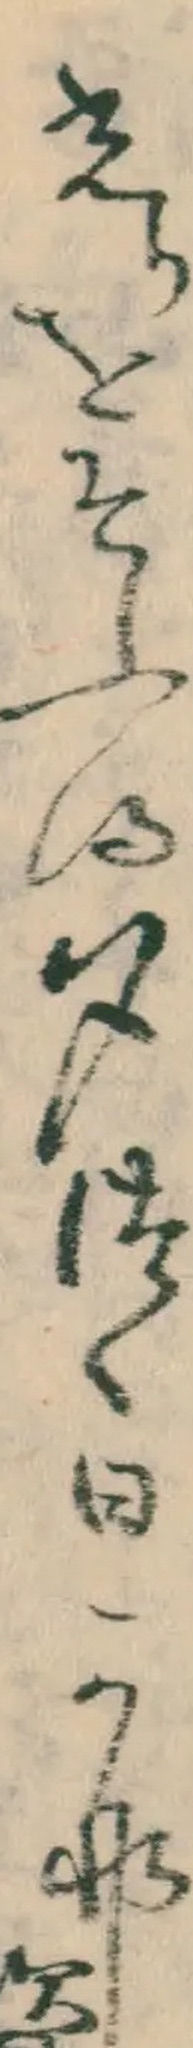光りをそふる夕つくひかな
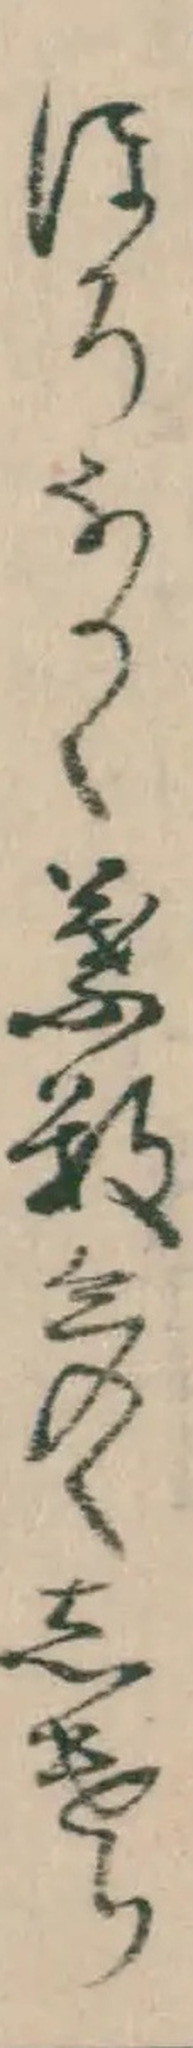ほそなかく葉数多くしけり
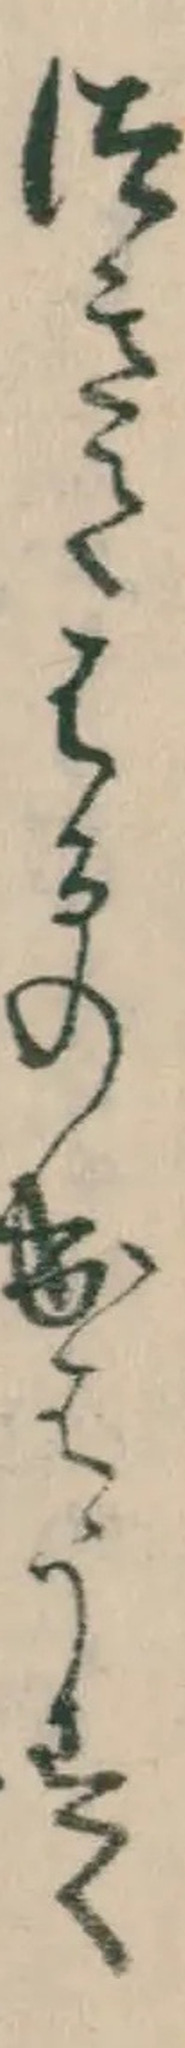つきてはるの出はうすく
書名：紅葉集
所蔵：国立国会図書館 National Diet Library, JAPAN
